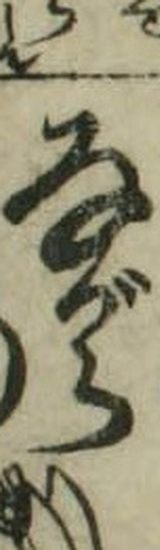ながら
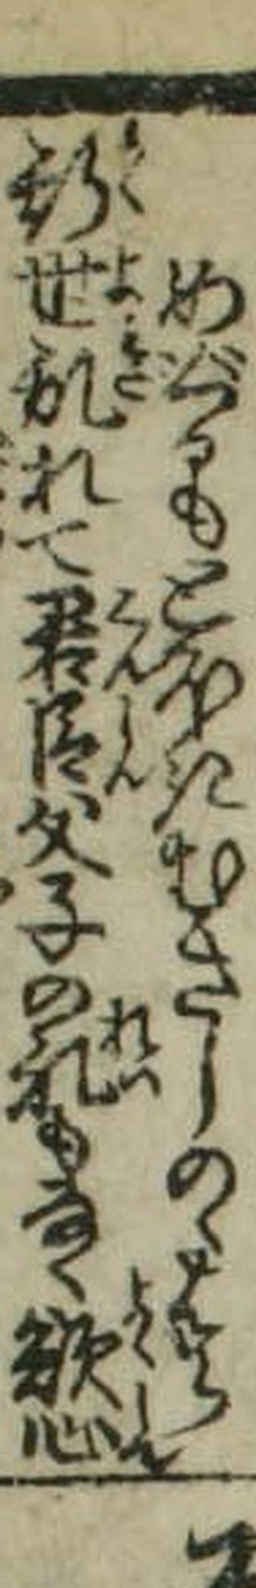斯世乱れて君臣父子の礼もなく欲心
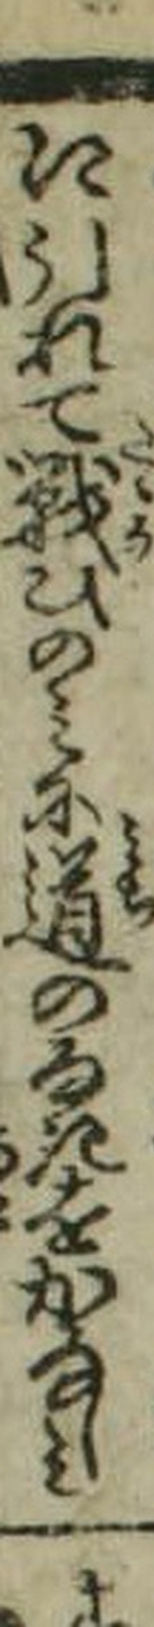に引れて戦ひのみに道のなきをかなしみ
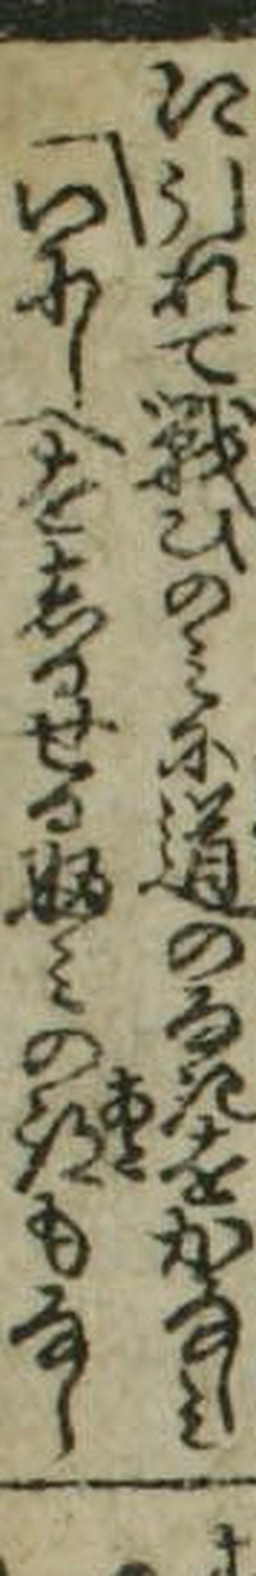〽いにしへをしるせるふみの跡もなし
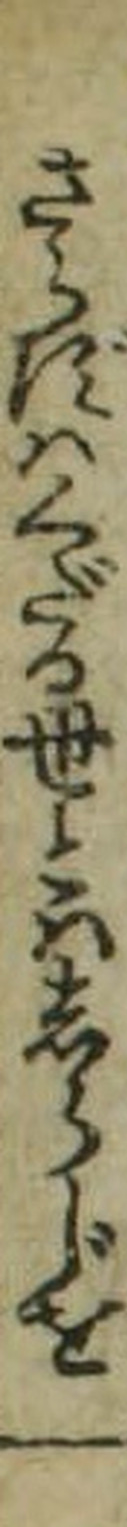さらずはくだる世とはしらじを
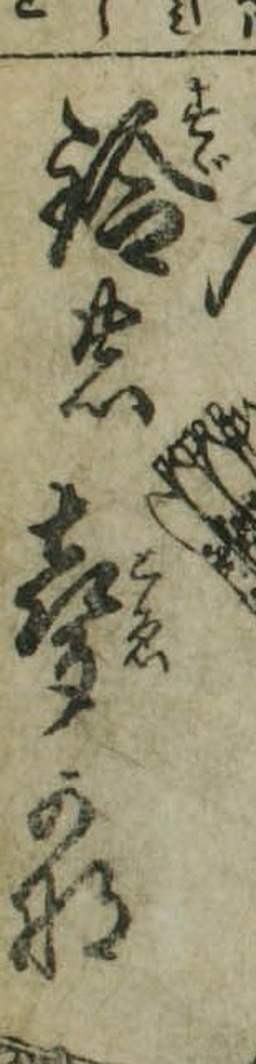鈴の声かな

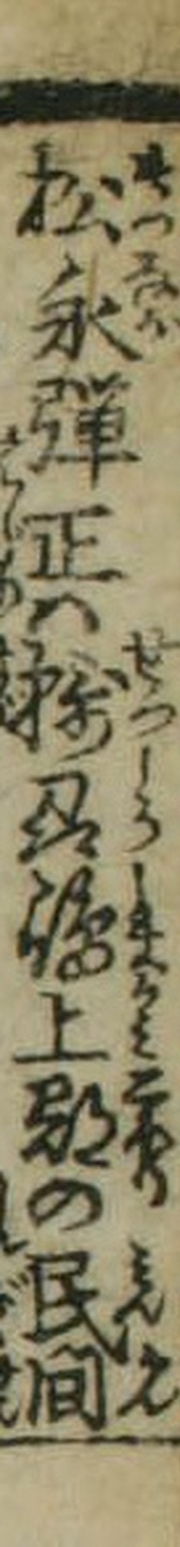松永弾正は摂州嶋上群の民間
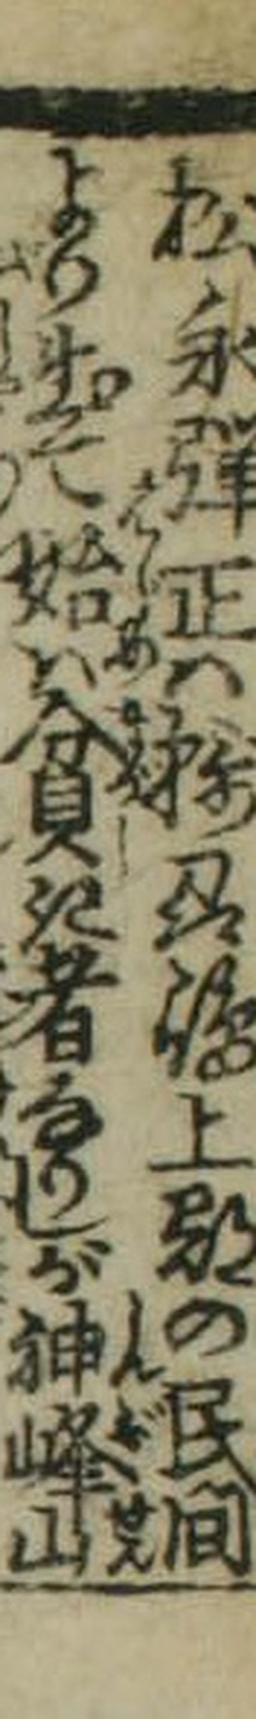より出て始は貧き者なりしが神峰山
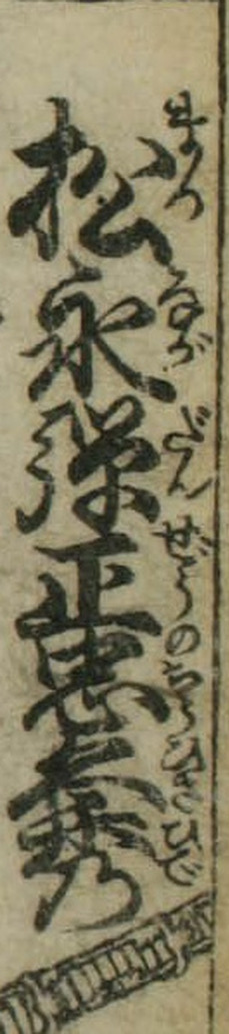松永弾正忠久秀
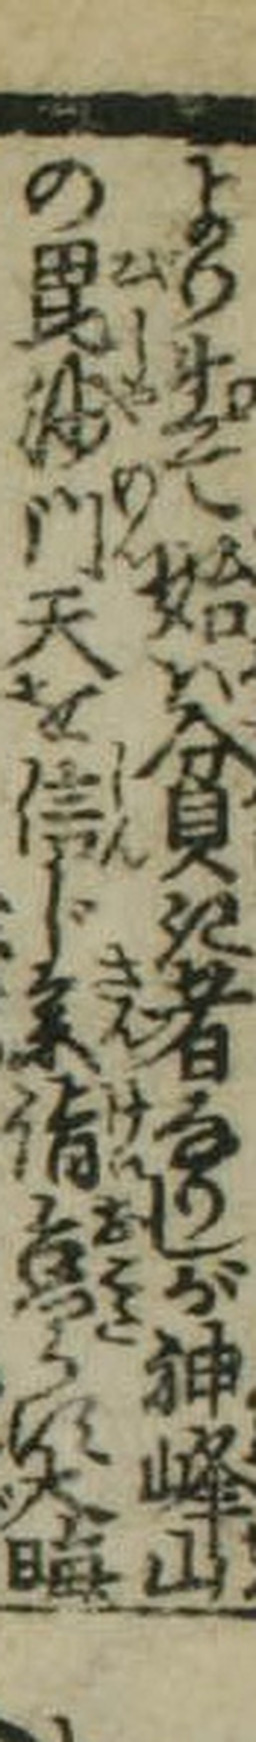の毘沙門天を信じ参詣怠らす大晦
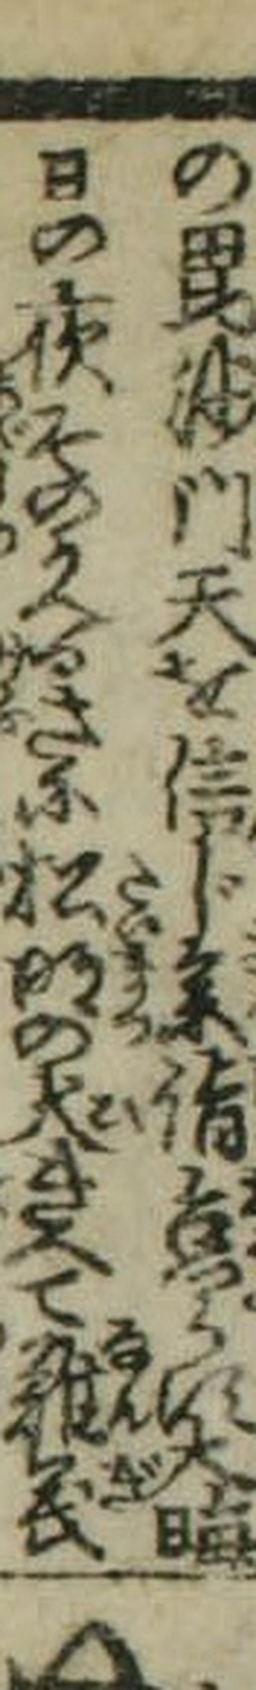日の夜そのかへるさに松明の火きへて難義
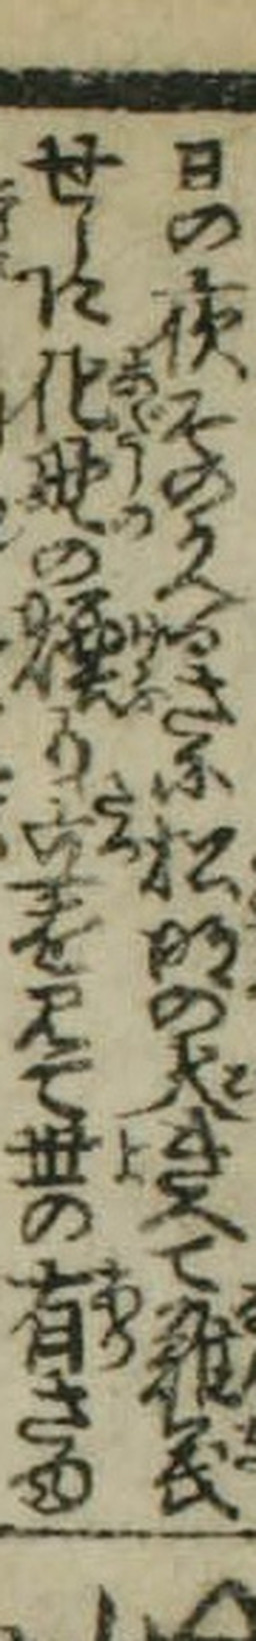せしに化野の煙り立を見て世の有さま
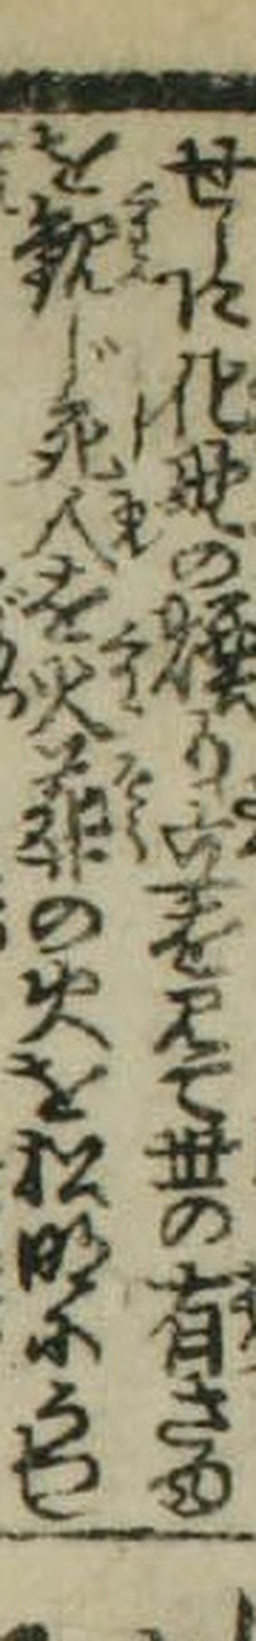を観じ死人を火葬の火を松明にうつし
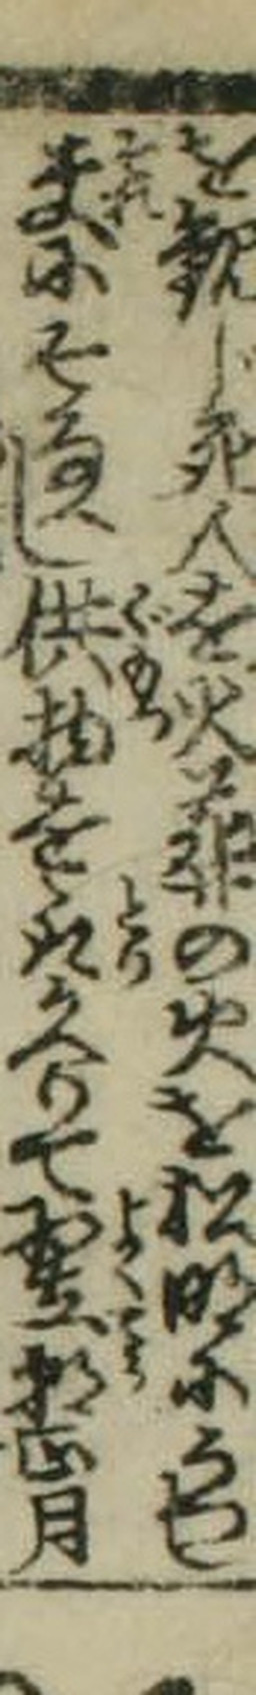夫にそなへし供物を取かへりて翌朝正月
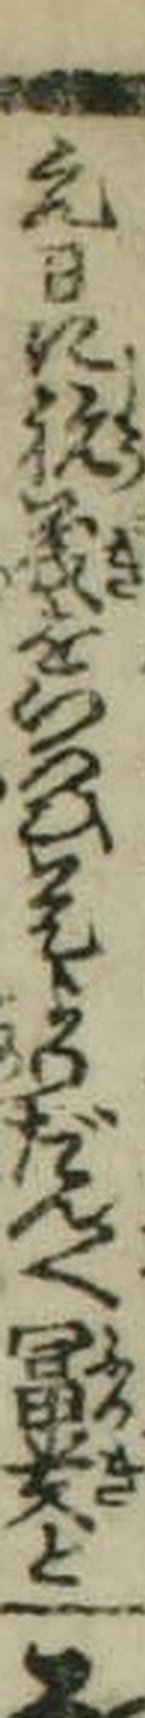元日に祝義をいはひ是よりだん〳〵冨貴と
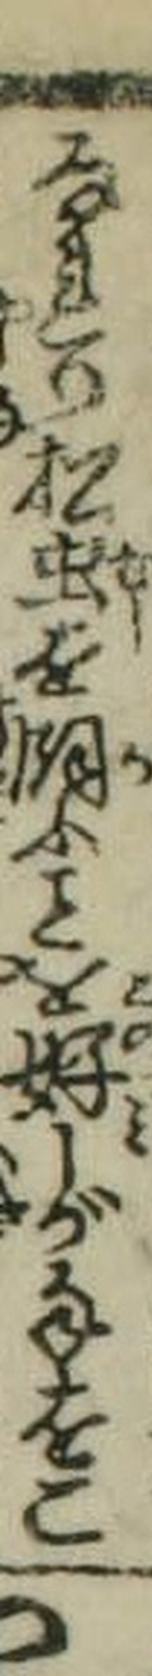なれり松虫を飼ふことを好しが手をこ
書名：續英雄百人一首
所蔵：東京学芸大学附属図書館
